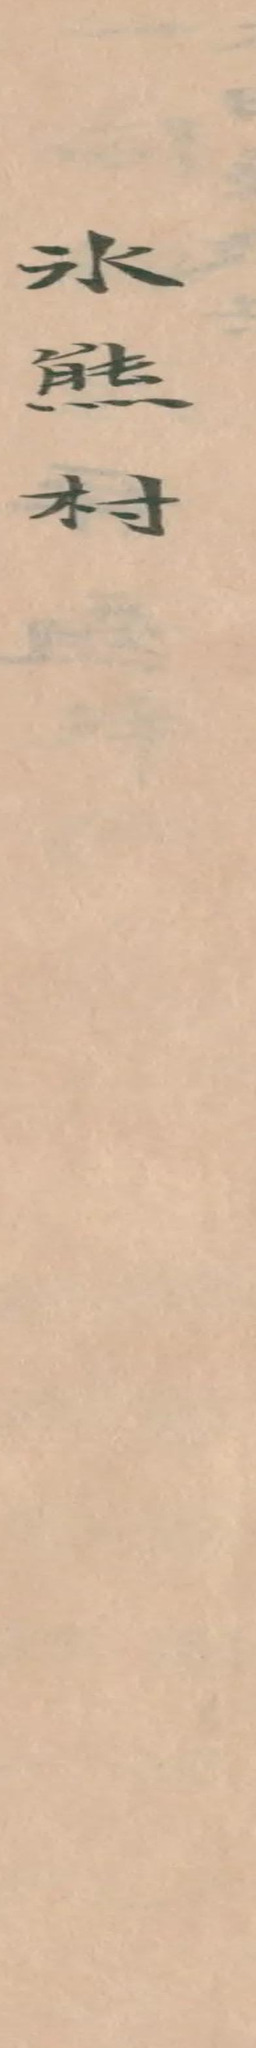氷熊村
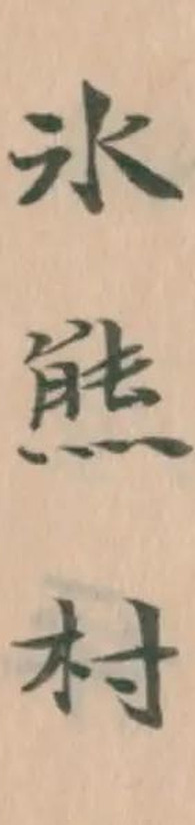氷熊村
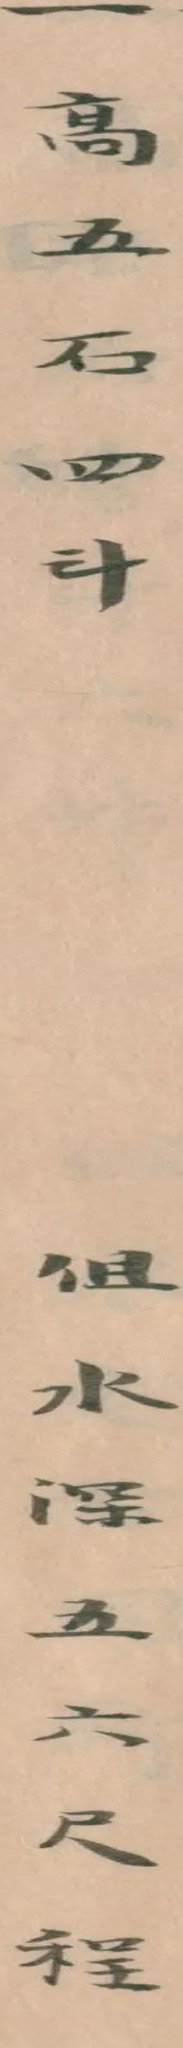一高五石四斗但水深五六尺程
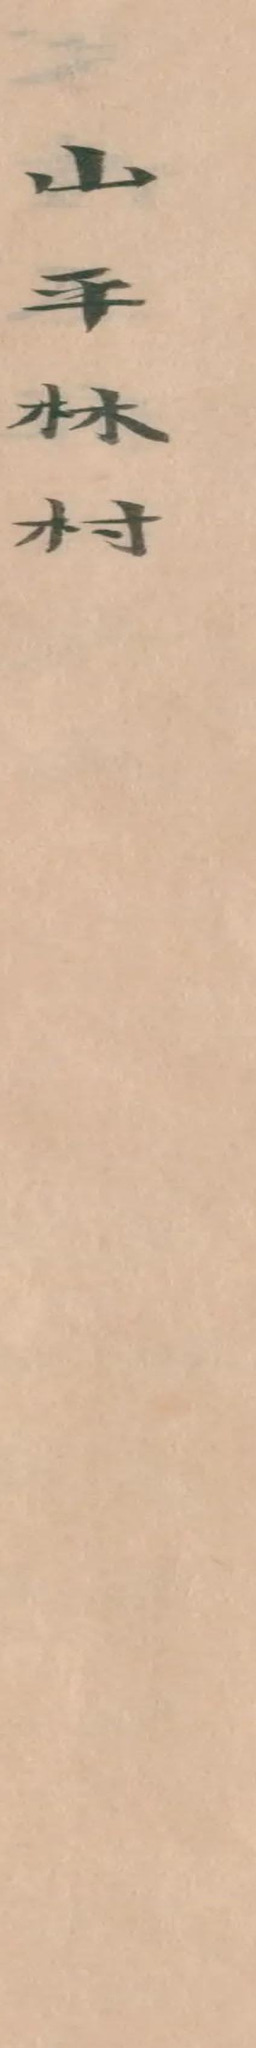山平林村
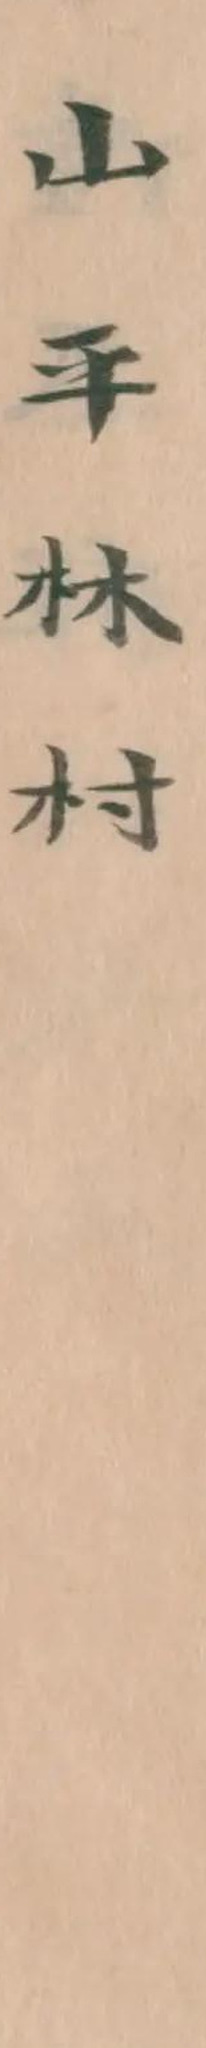山平林村
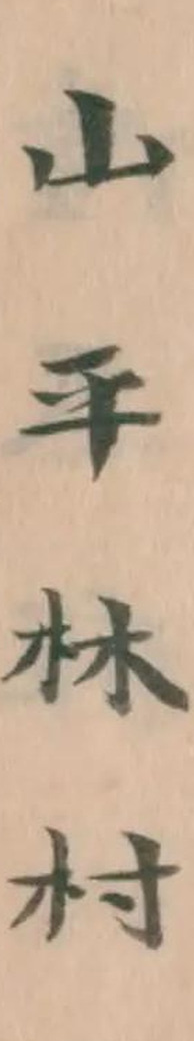山平林村
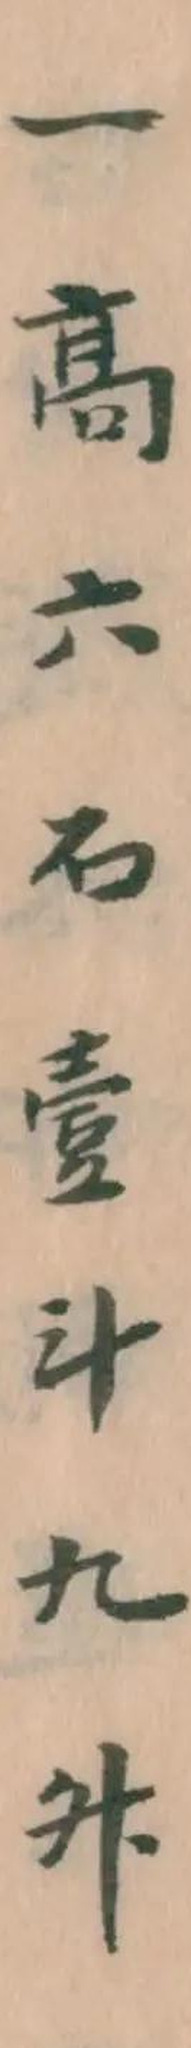一高拾六石貮斗七升
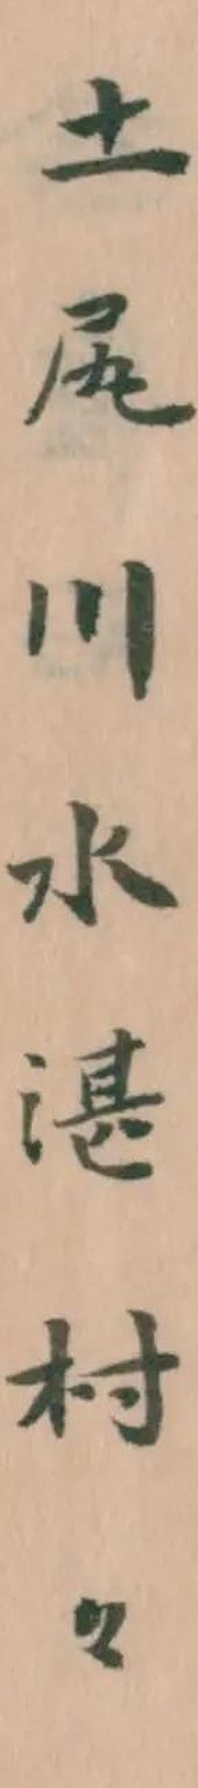土尻川水湛村々
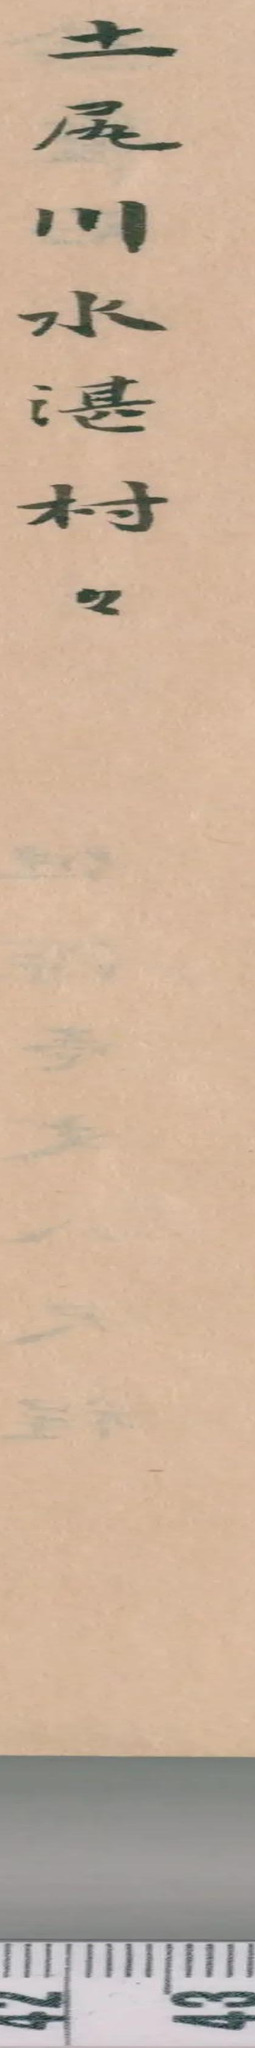土尻川水湛村々
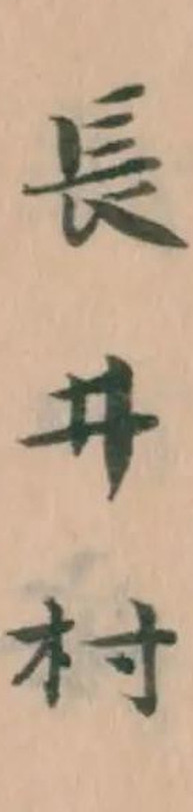長井村
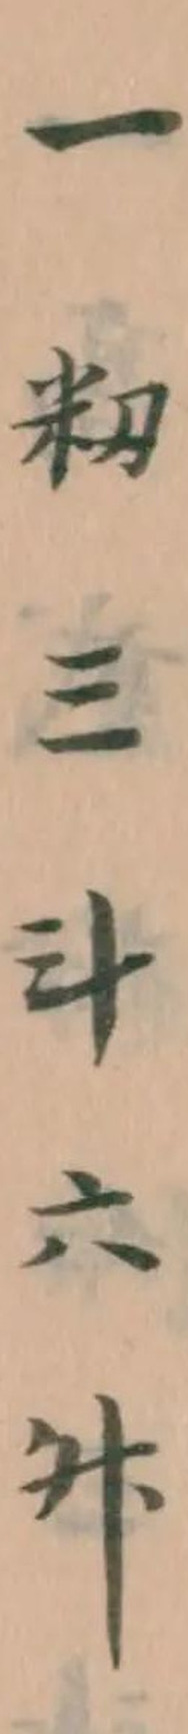一籾三斗六升
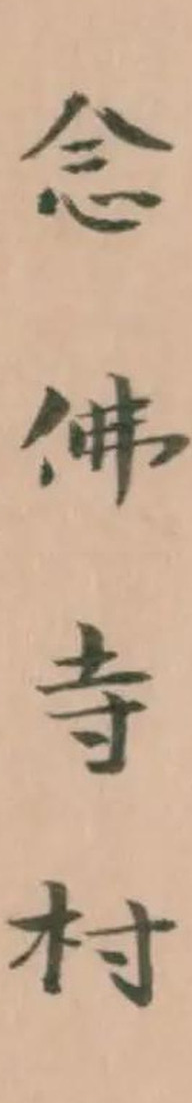念仏寺村
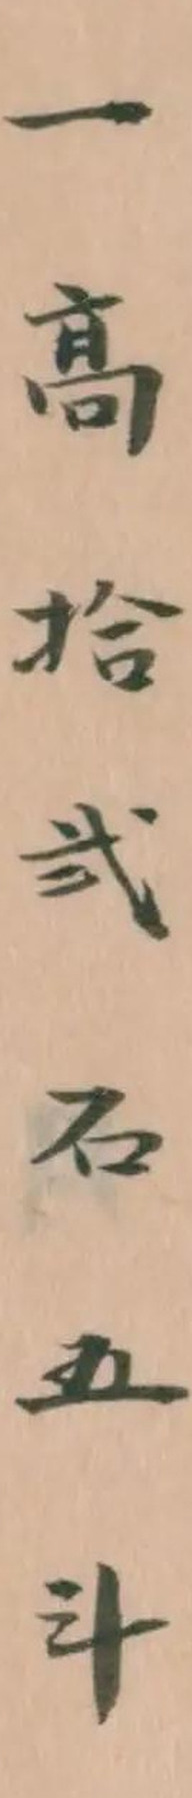一高拾弐石五斗
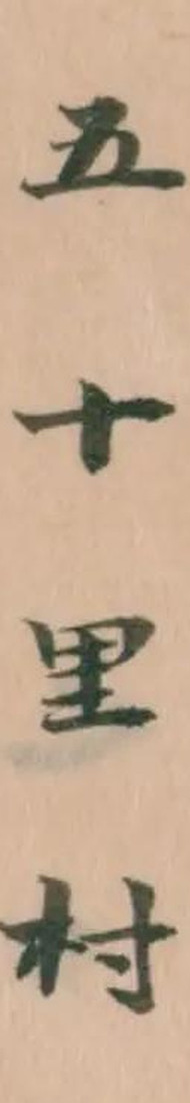五十里村
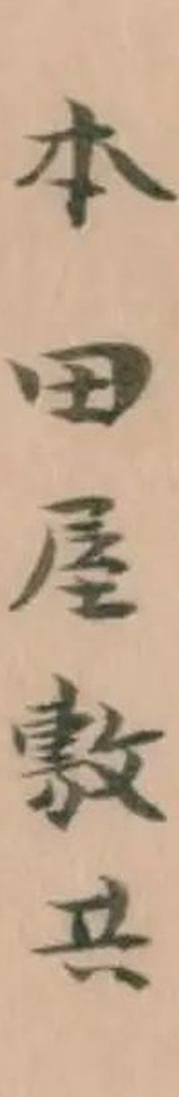本田屋敷共
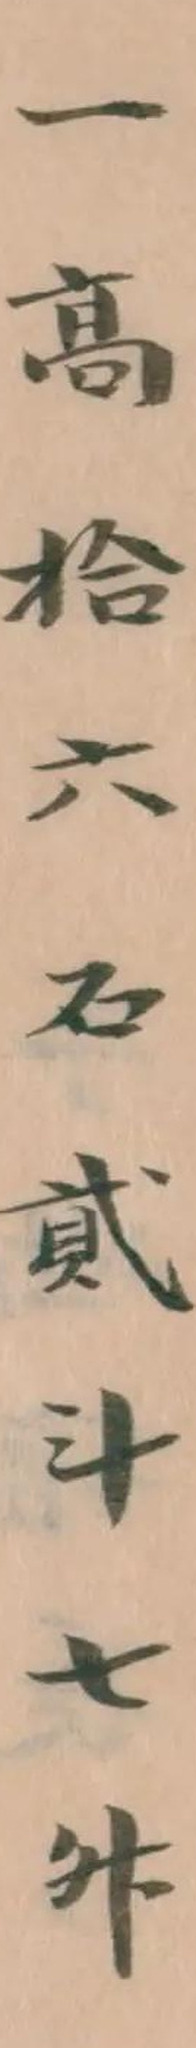一高拾六石貮斗七升
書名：地災撮要. 巻5-6(地震之部)
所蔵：国立国会図書館 National Diet Library, JAPAN
